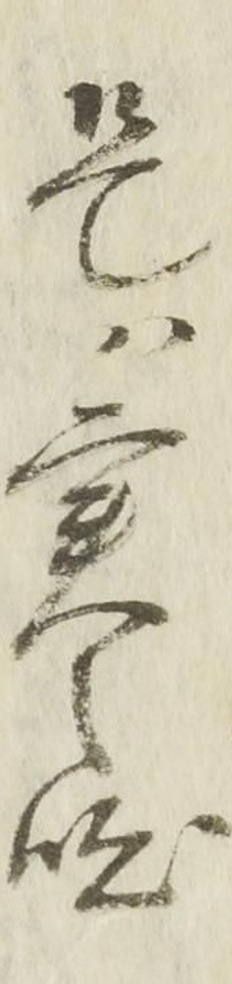是ハ実之咄
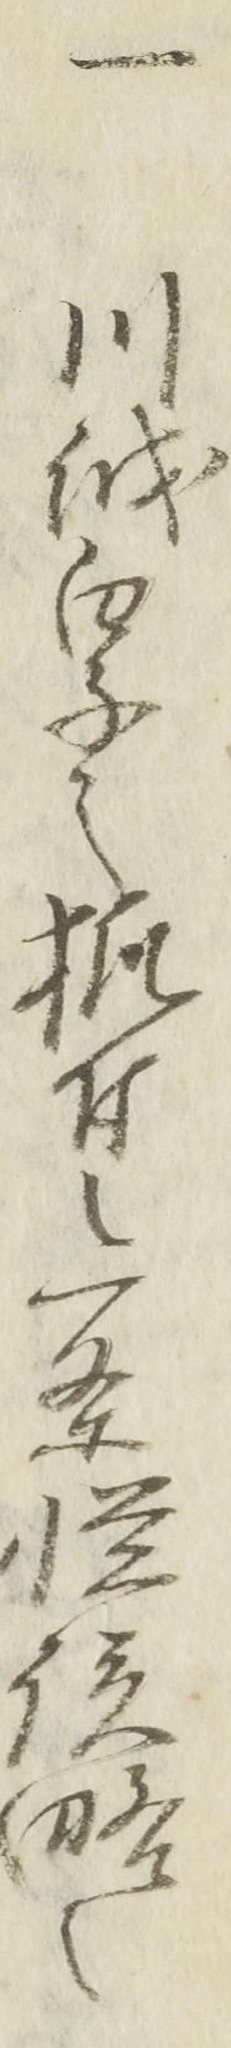一川越白子之狐付之一条怪後略し
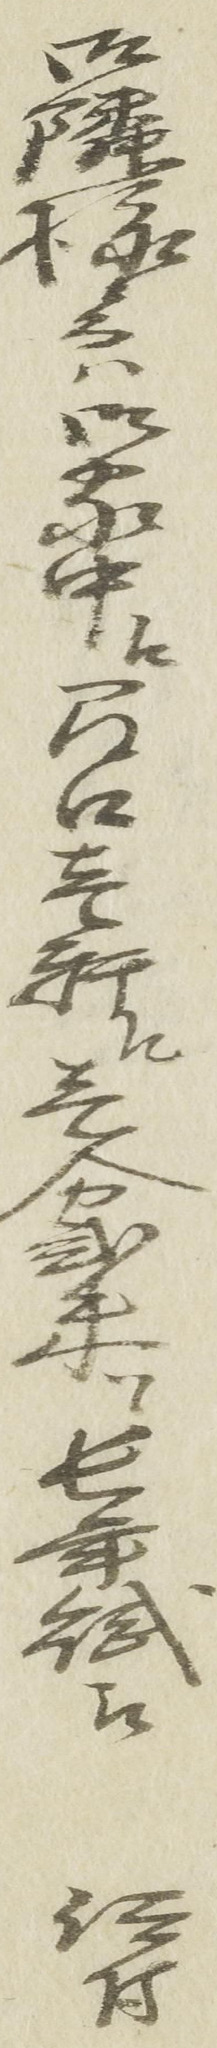一御隣様ニ而ハ御家中江間口壱軒江壱分弐朱ツヽ長年賦被仰付
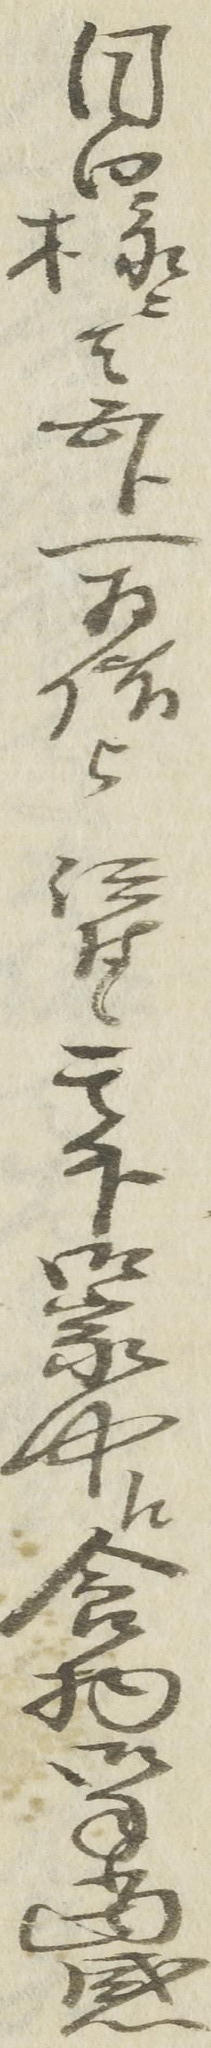目白様ニは五分一拝借被仰付候其外御家中へ食物御手当感
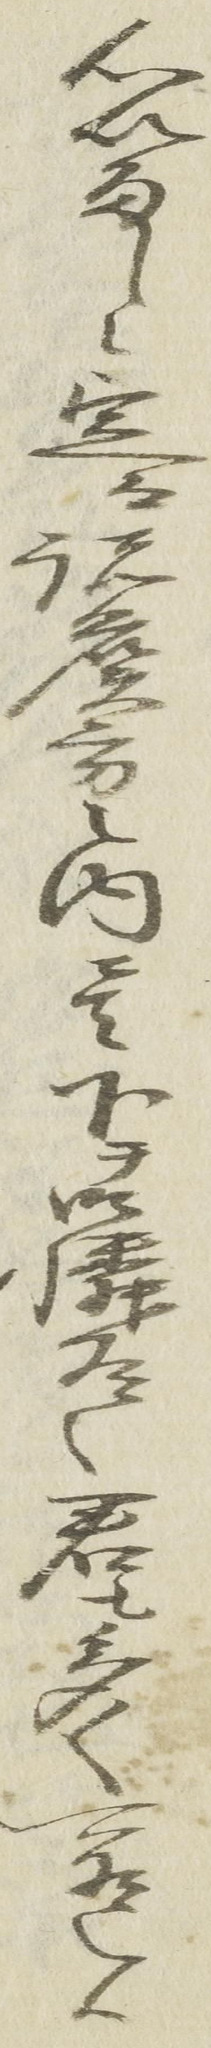心いたし候定而諸侯方之内二者下ヲ御憐有之君も多く可有之候
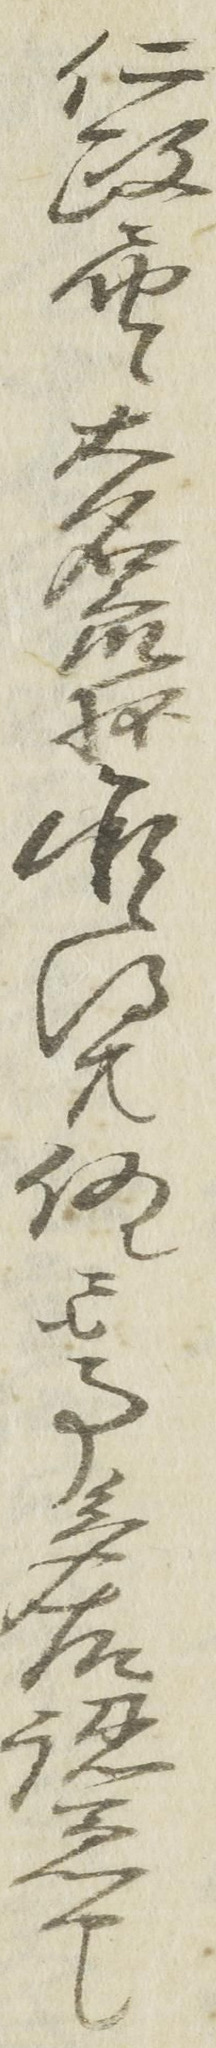仁政届候大名衆抔承候得共何レニも事多故認兼申候
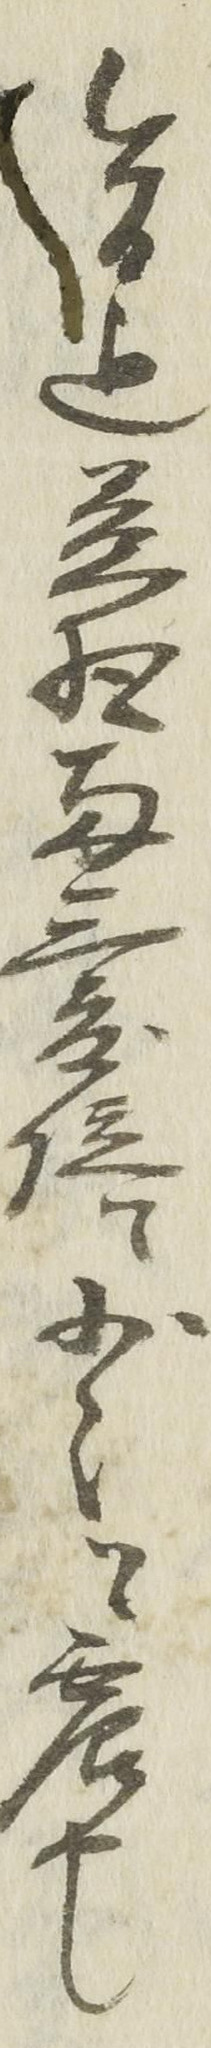一今日迄昼夜両三度位ツゝ少しツヽ震申候
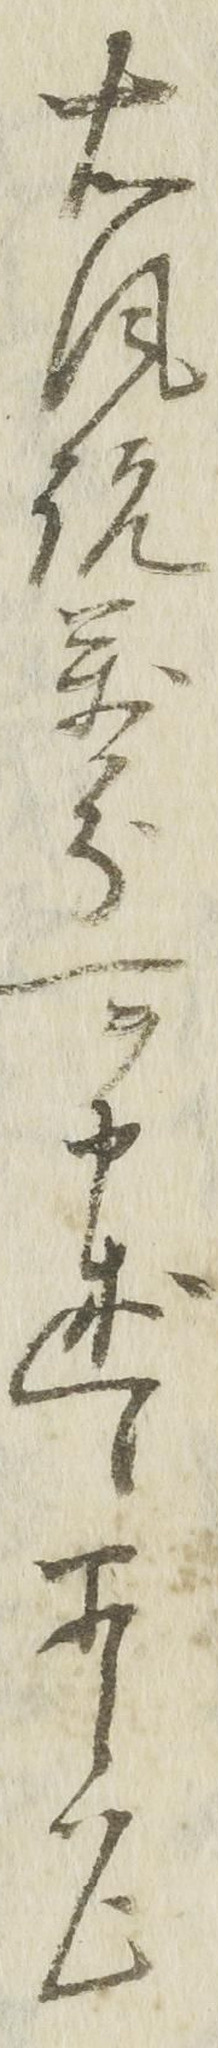右風説万分一ヲ申述候早〻以上
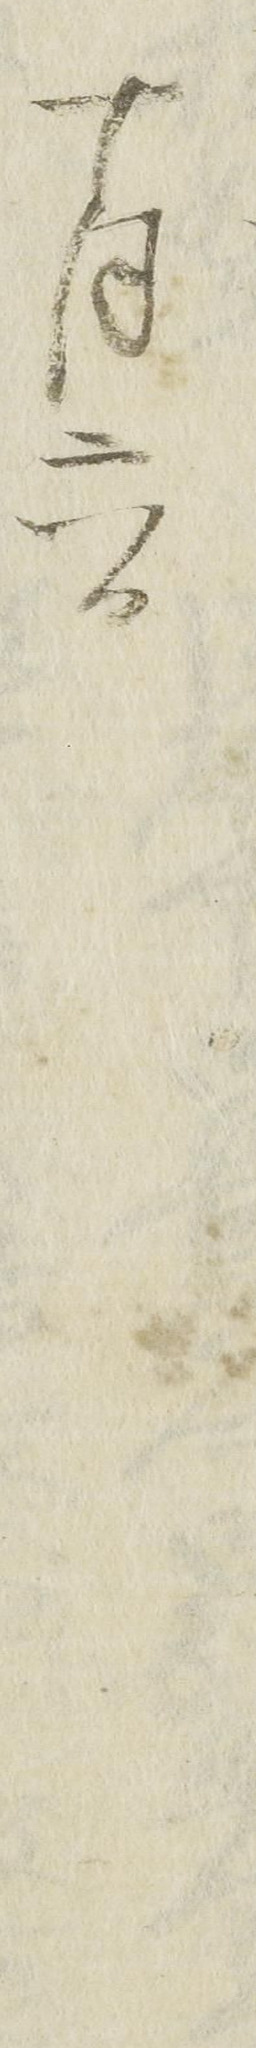十月六日
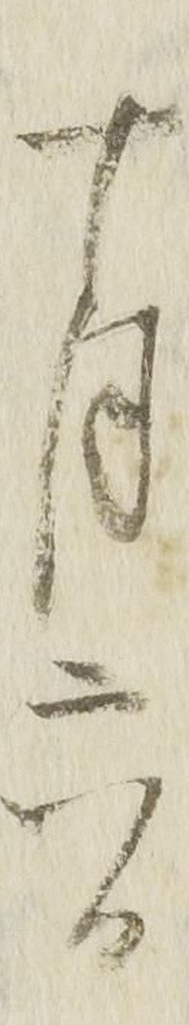十月六日

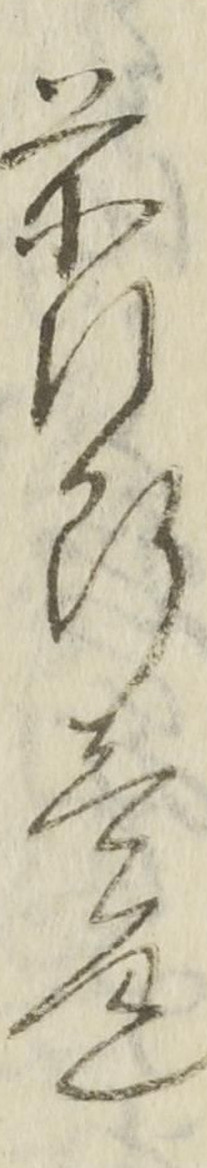前同断壱通
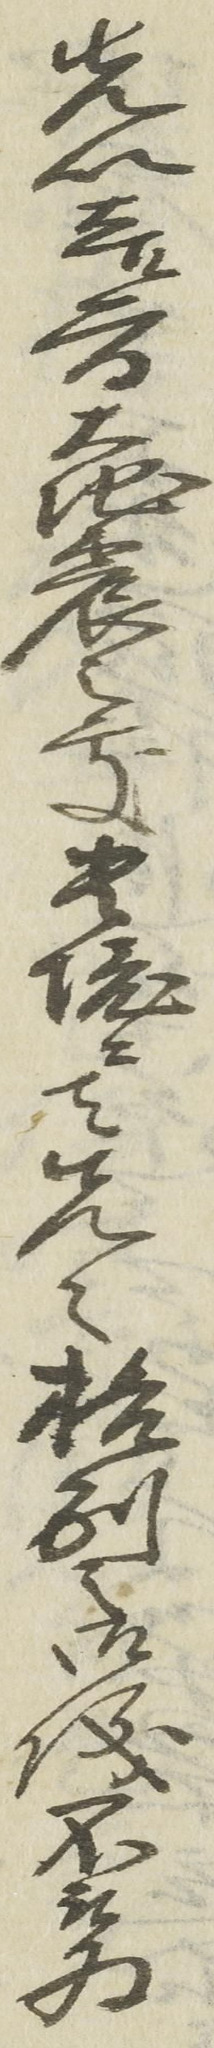先以去ル二日大地震之処貴院ニは先〻格別之御儀不被為
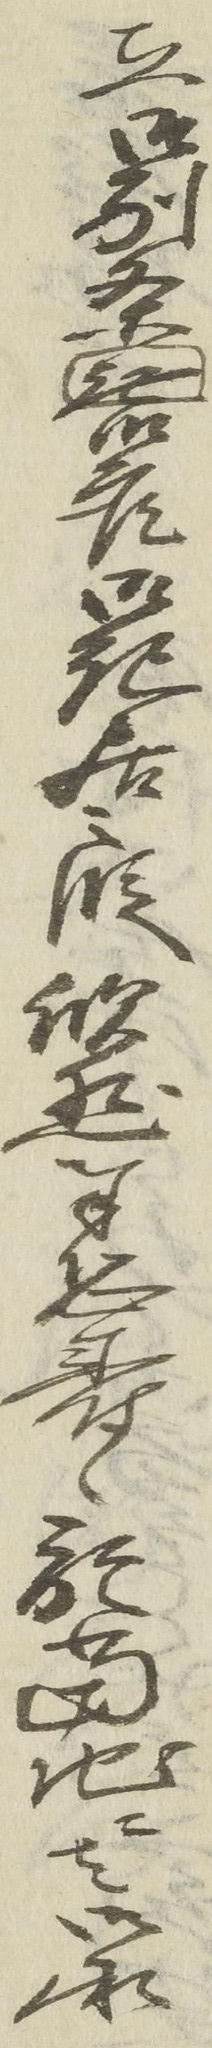在御別条無御座御起居之段欣然奉恐寿候於当地ニは御承
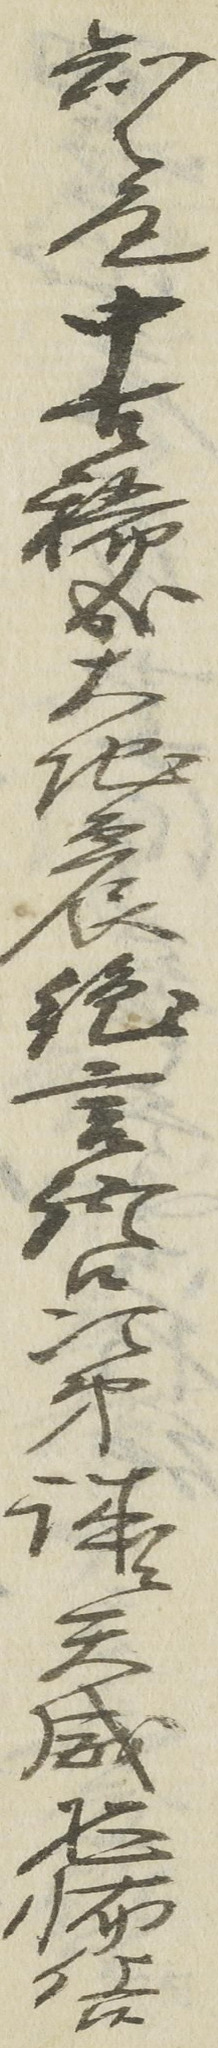知之通中古稀成大地震絶言語候次第誠ニ天威恐怖仕候
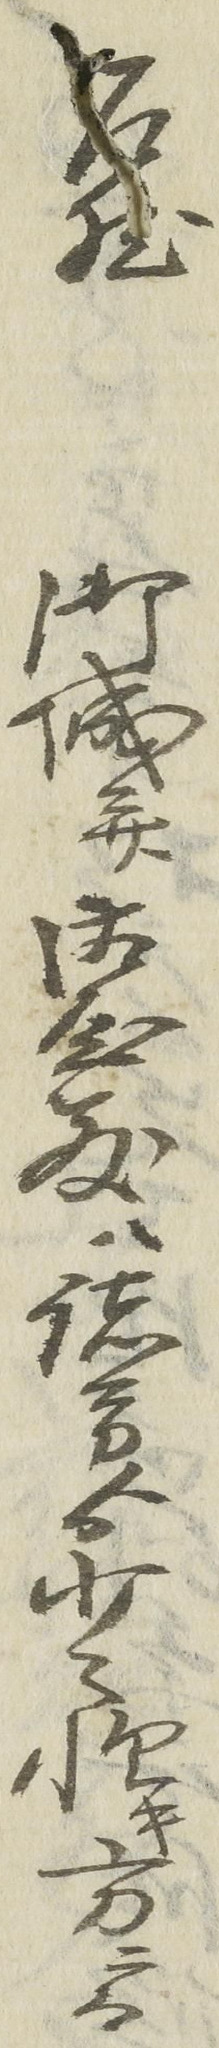乍然御城幷御屋敷ハ諸方ゟ少〻軽キ方ニ而
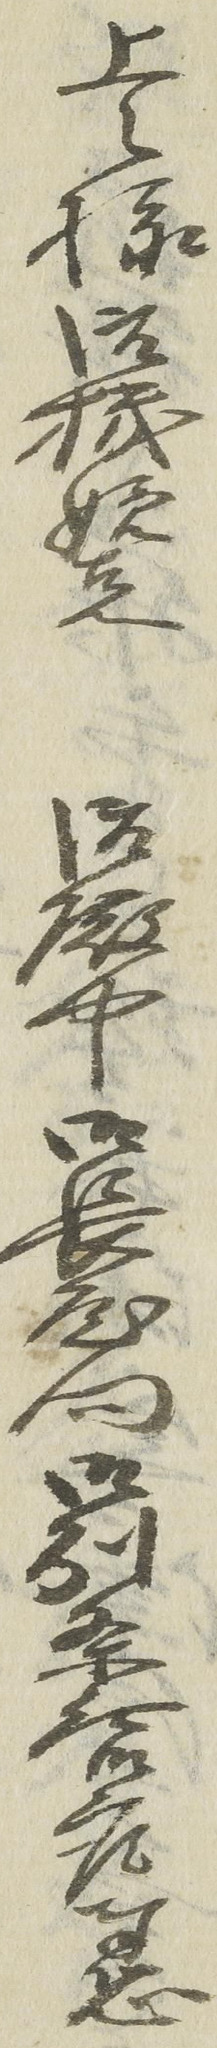上〻様御機嫌克御殿中御長屋向御別条無御座奉恐
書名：安政乙卯江戸大地震筆記　安政丙辰八月大阪大雷雨之記追加　安政三辰年七月松前辺大地震并八月大風雨記録
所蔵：東京大学地震研究所図書室 Earthquake Research Institute Library, The University of Tokyo, JAPAN
